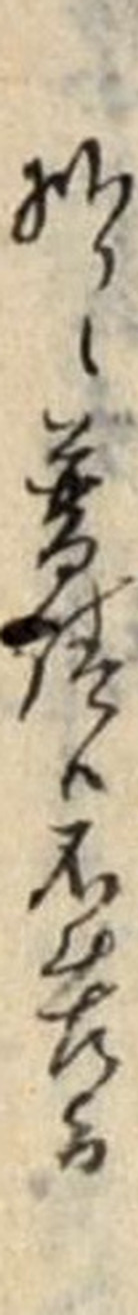掛り之普請は不苦旨

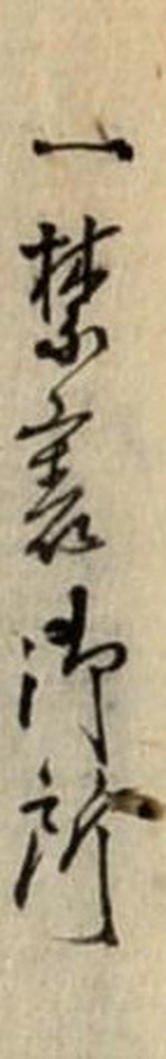一禁裏御所
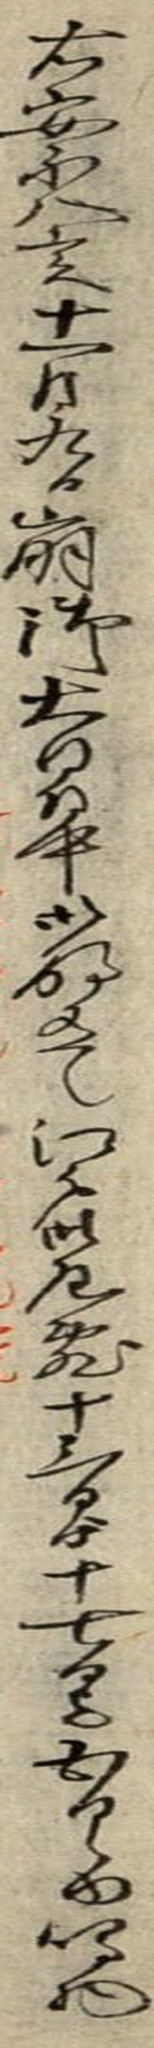右安永八亥十一月九日崩御大目付中御触有之江戸御屋敷十三日ゟ十七日迄五日之内鳴物
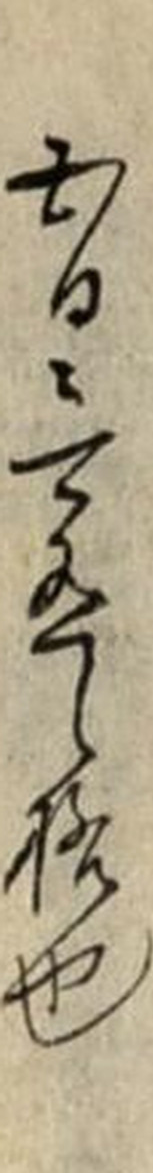五日に可有之格也
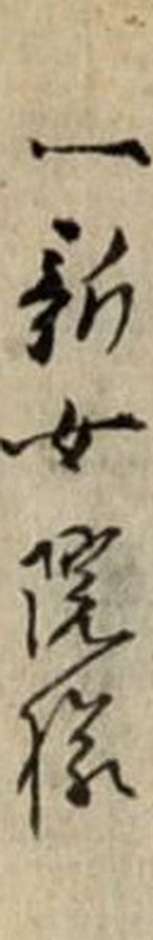一新女院様
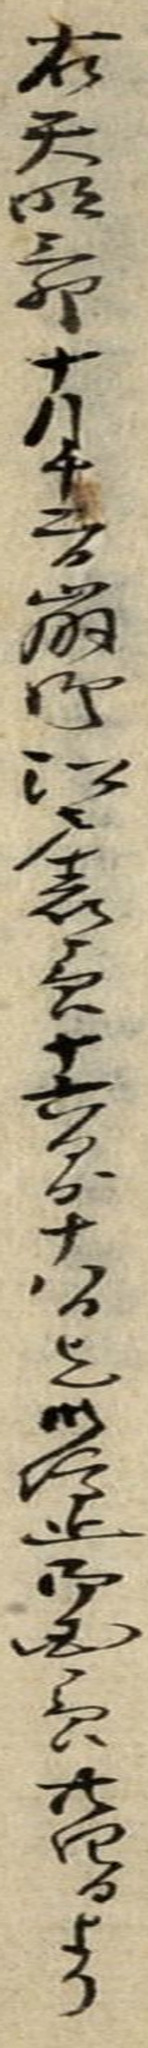右天明三卯十月十二日崩御江戸表にては十六日ゟ十八日迄御停止御国にては廿四日より
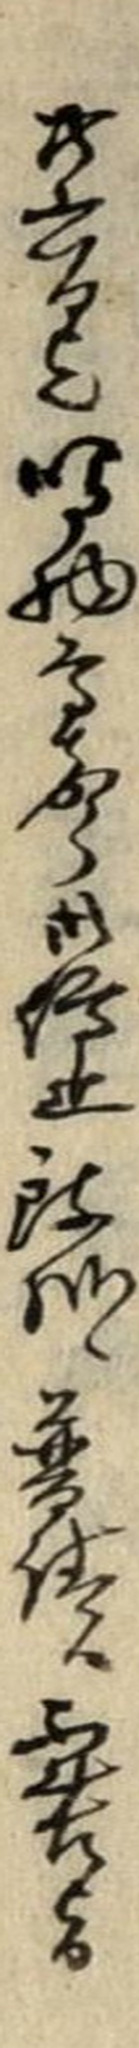廿六日迄鳴物高声御停止致掛候普請は不苦旨
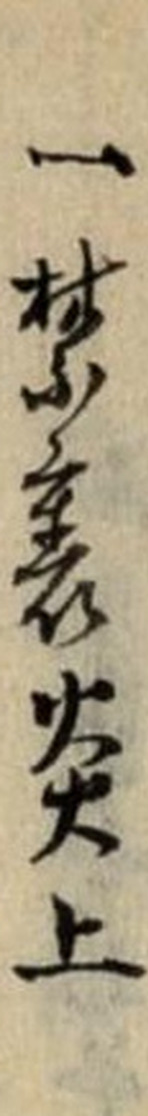一禁裏炎上
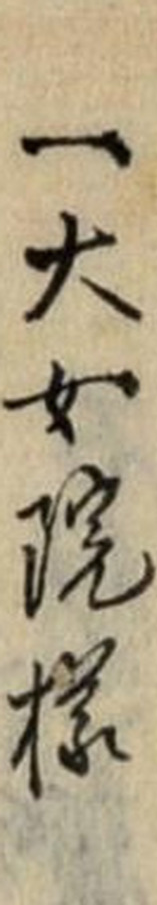一大女院様
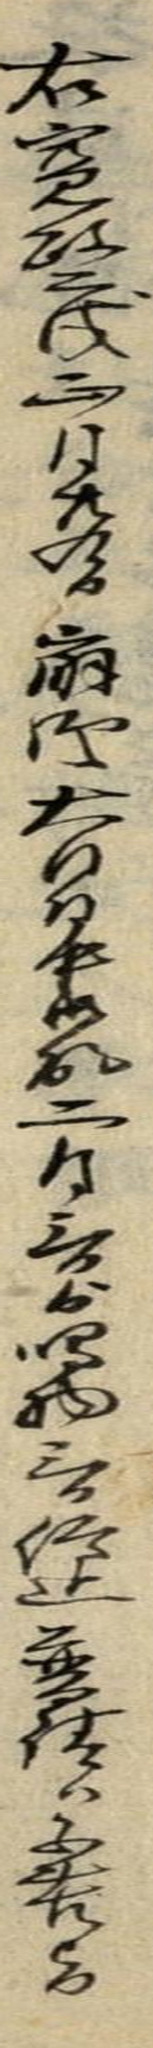右寛政二戌正月廿九日崩御大目付中御触二月三日ゟ鳴物三日停止普請は不苦旨
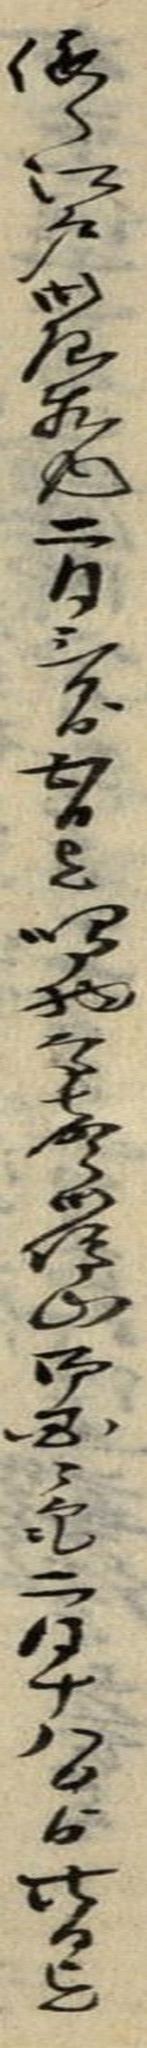依之江戸御屋敷内二月三日ゟ五日迄鳴物高声御停止御国にても二月十八日ゟ廿日迄
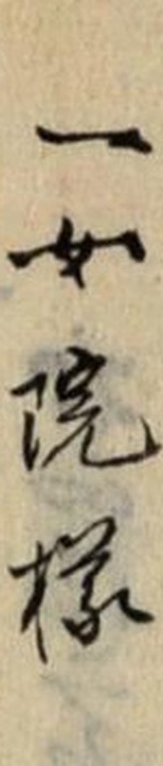一女院様
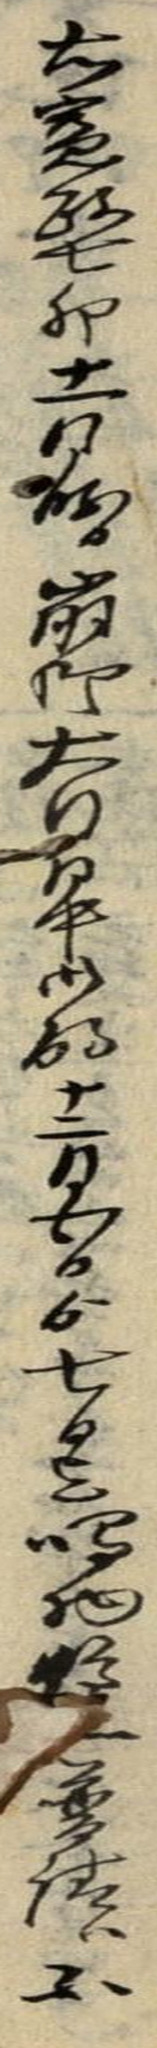右寛政七卯十一月晦日崩御大目付中御触十二月五日ゟ七日迄鳴物停止普請は不
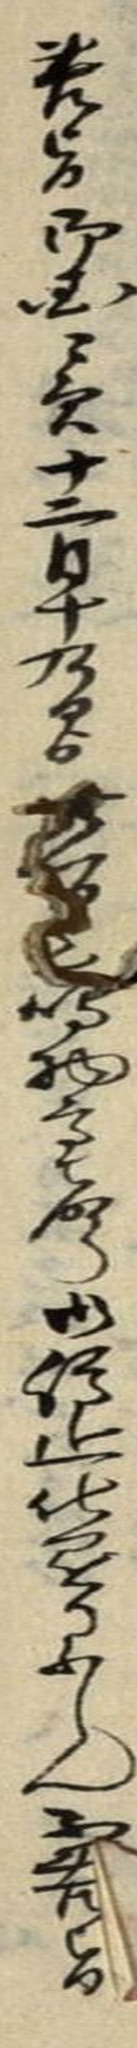苦旨御国にては十二月十九日ゟ廿一日迄鳴物高声御停止仕懸りふしん不苦旨
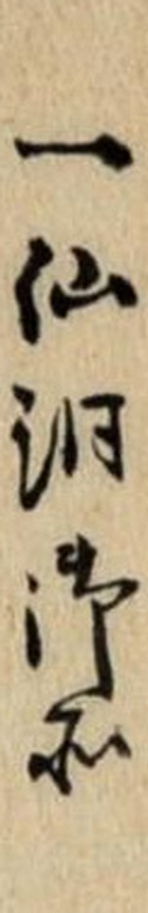一仙洞御所
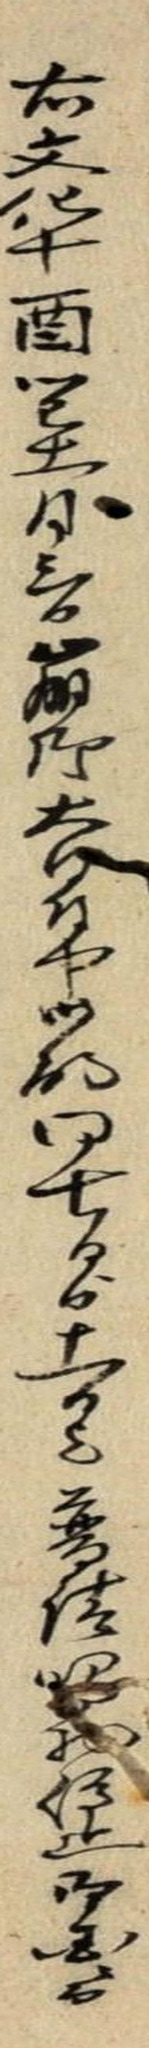右文化十酉閏十一月三日崩御大目付中御触同七日ゟ十一日迄普請鳴物停止御国にて
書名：御停止異変死失
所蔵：福井県文書館 Fukui Prefectural Archives
